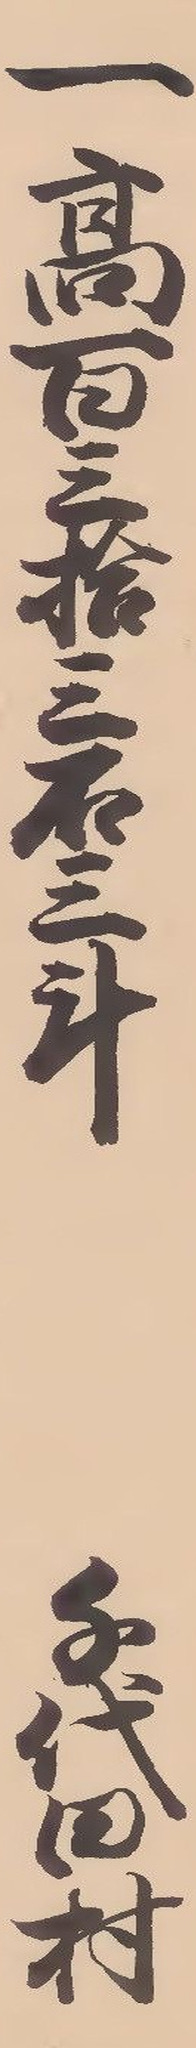一高百三拾三石三斗千代田村
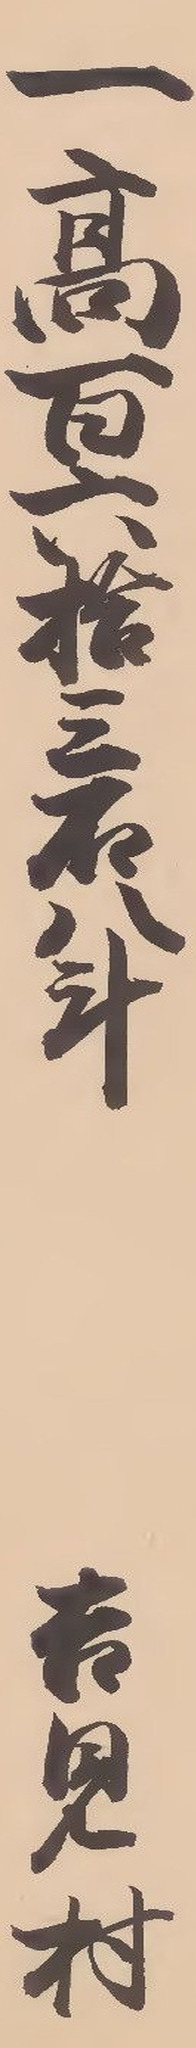一高百六拾三石八斗吉見村
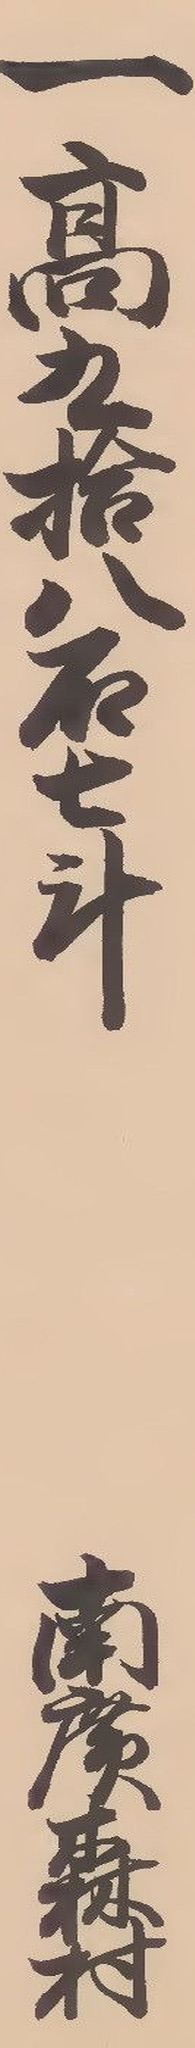一高九拾八石七斗南広森村
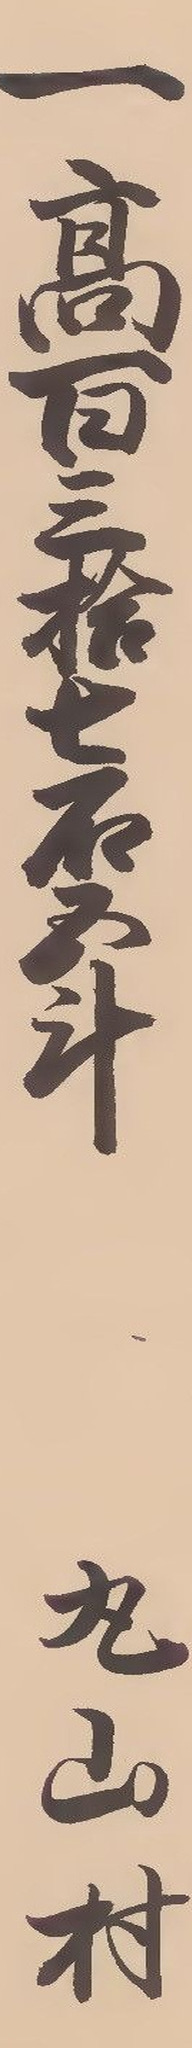一高百三拾七石五斗丸山村

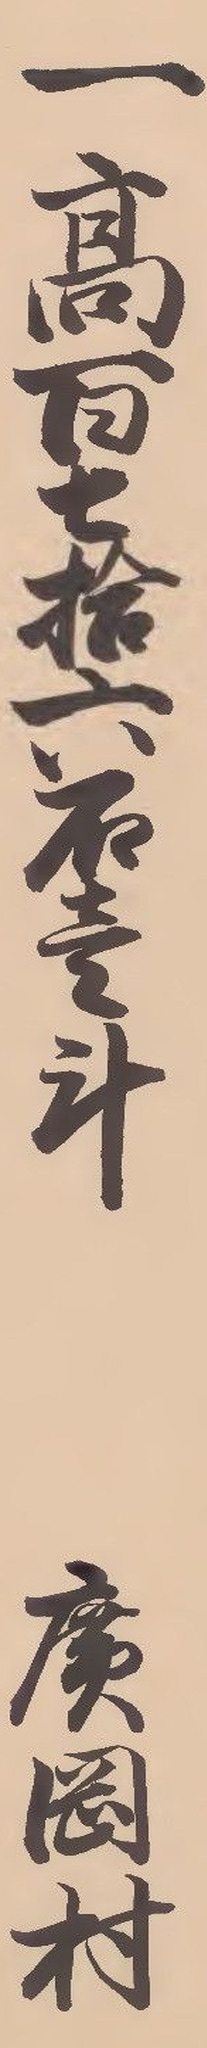一高百七拾六石壱斗広岡村
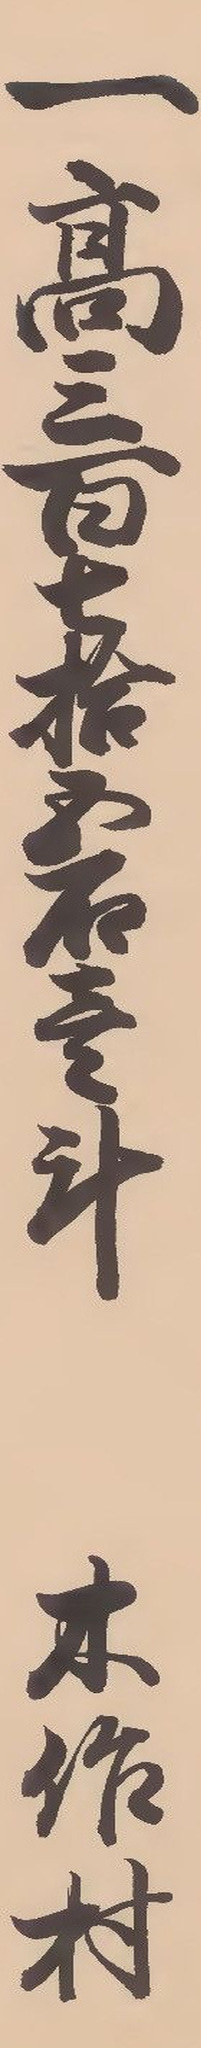一高三百七拾五石壱斗木作村
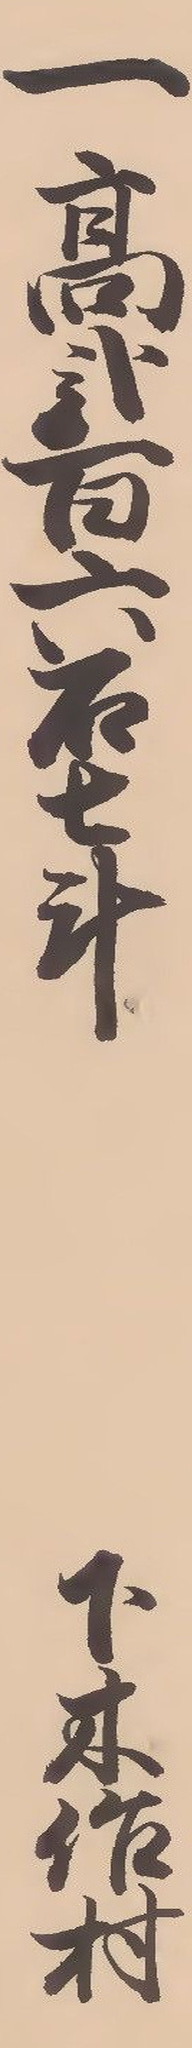一高弐百六石七斗下木作村
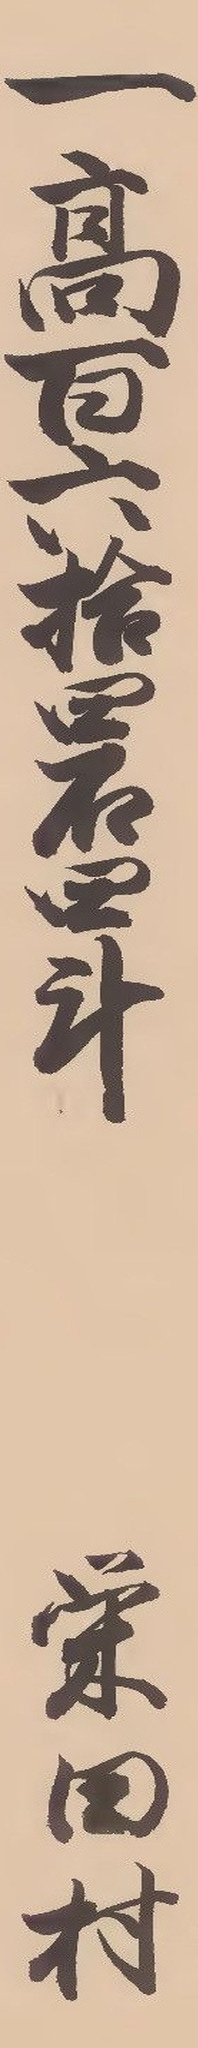一高百六拾四石四斗栄田村
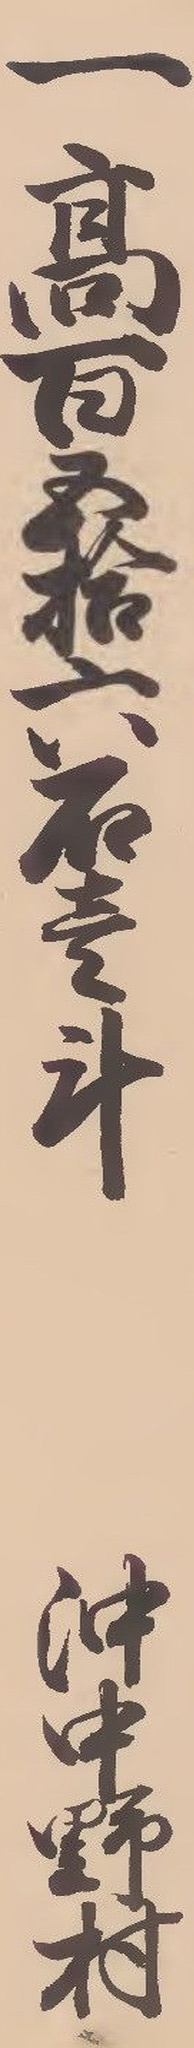一高百五拾六石壱斗沖中野村

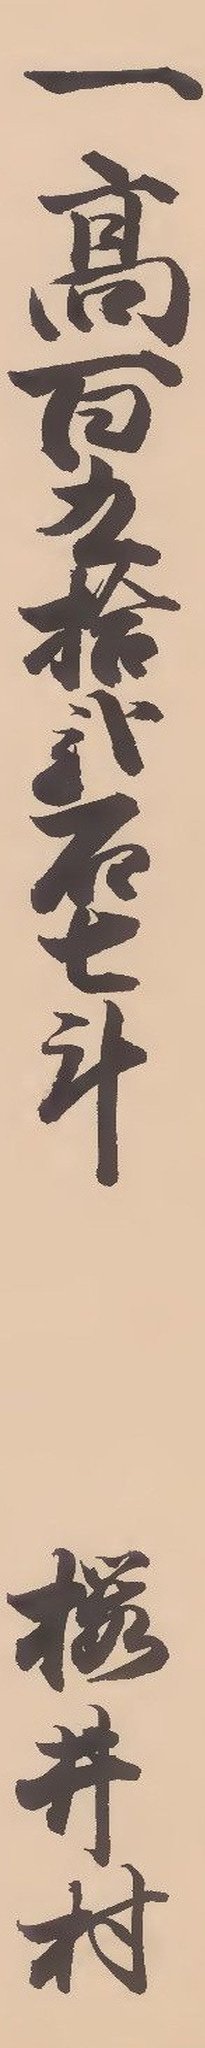一高百九拾弐石七斗桜井村
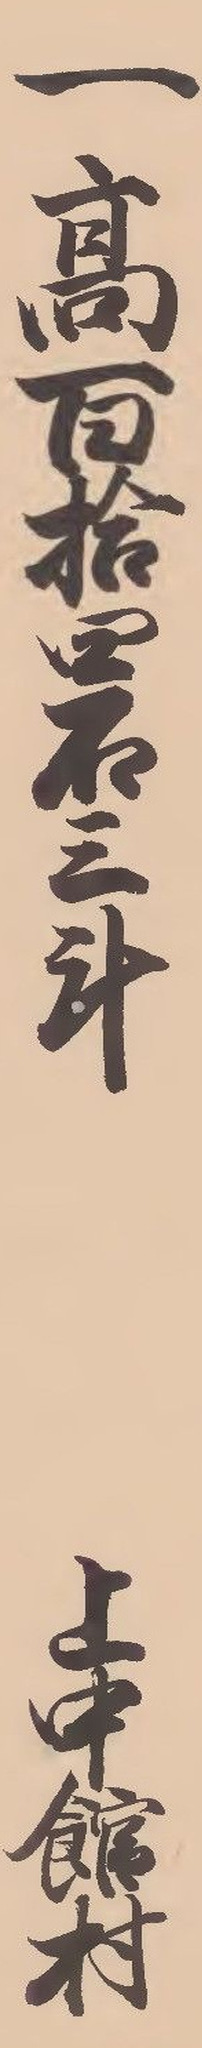一高百拾四石三斗上中館村
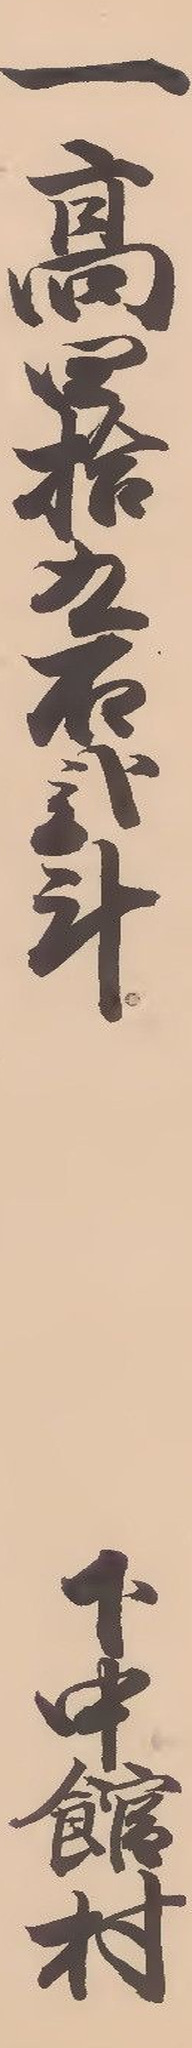一高四拾九石弐斗下中館村
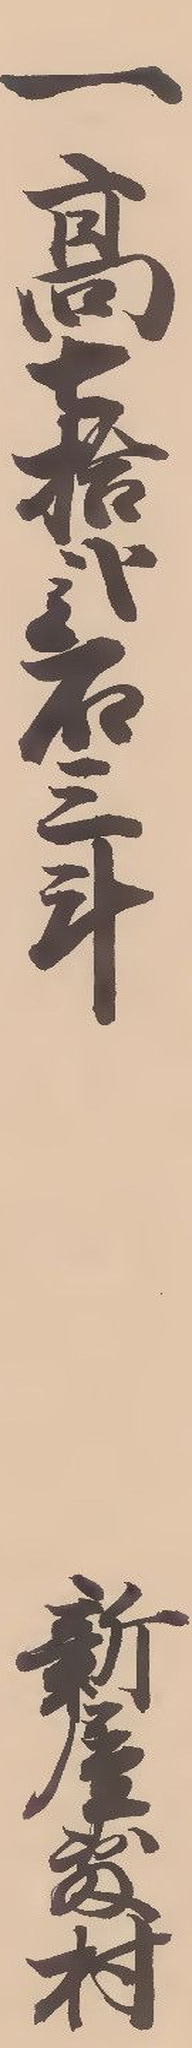一高七拾弐石三斗新屋敷村
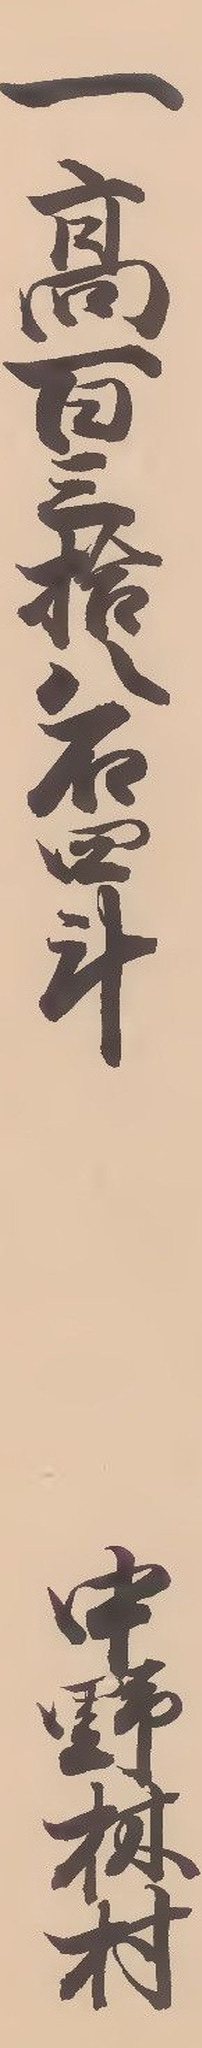一高百三拾八石四斗中野林村

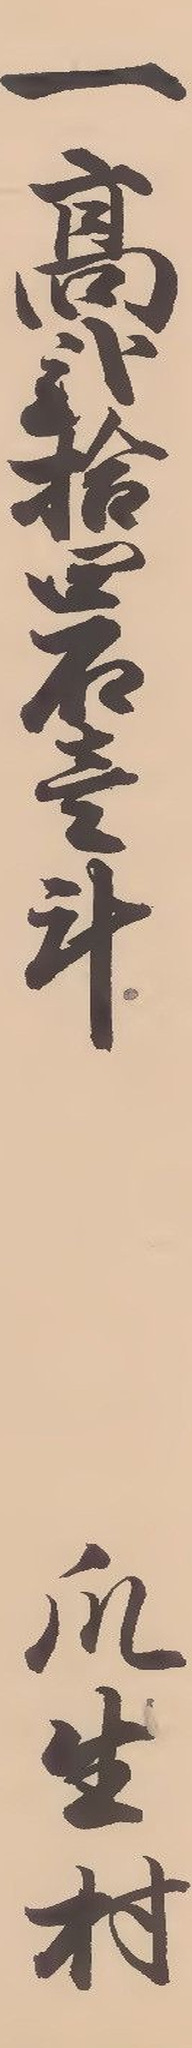一高弐四石壱斗爪生村
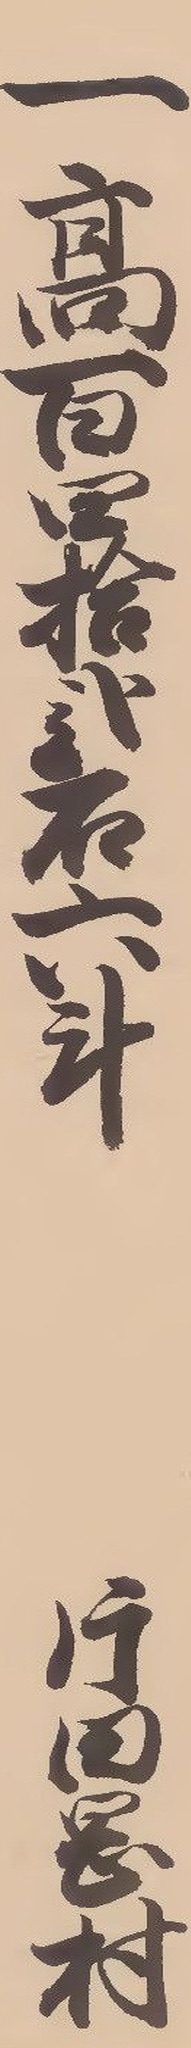一高百四拾弐石六斗片田岡村
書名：陸奥国郷帳　７
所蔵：国立公文書館 National Archives of Japan
